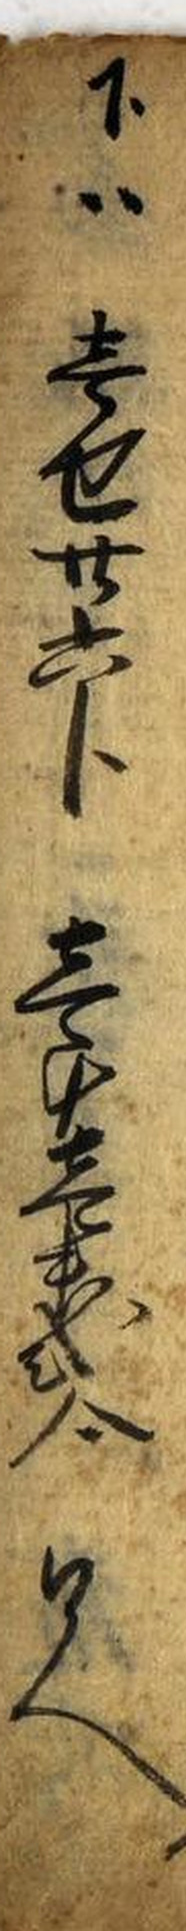下同壱セ廿六分壱斗壱升弐合同人

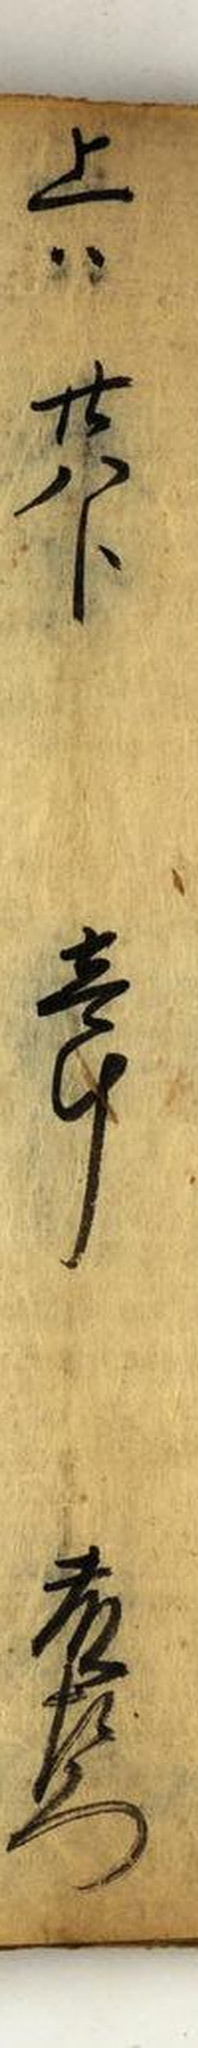上同廿八分壱斗藤左衛門
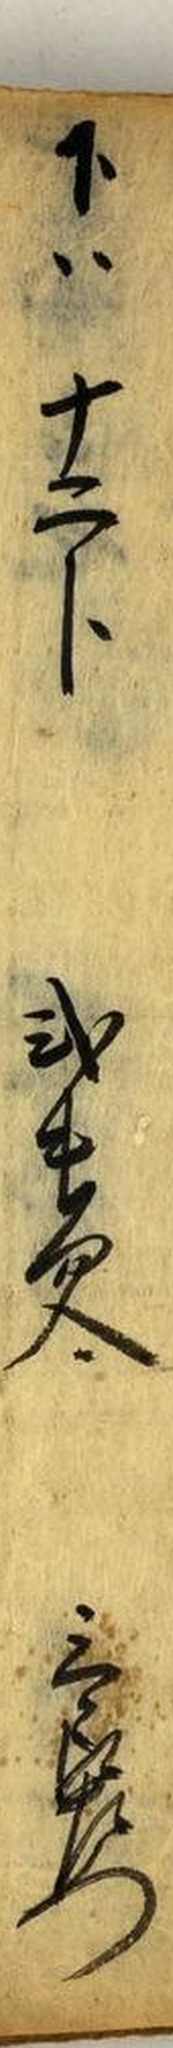下同十二分弐升四合三郎左衛門
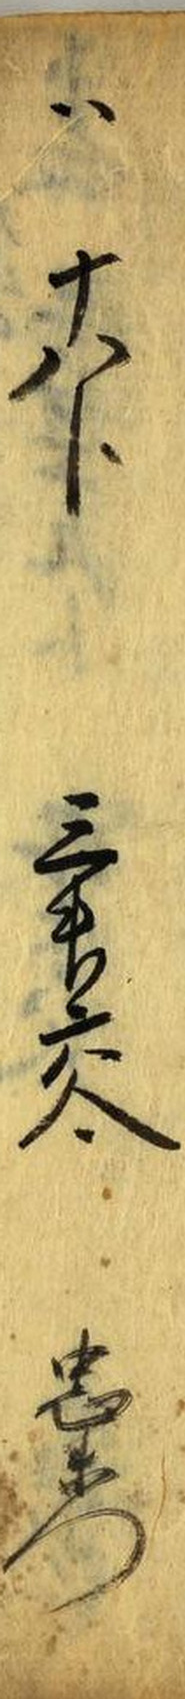同十八分三升六合忠右衛門
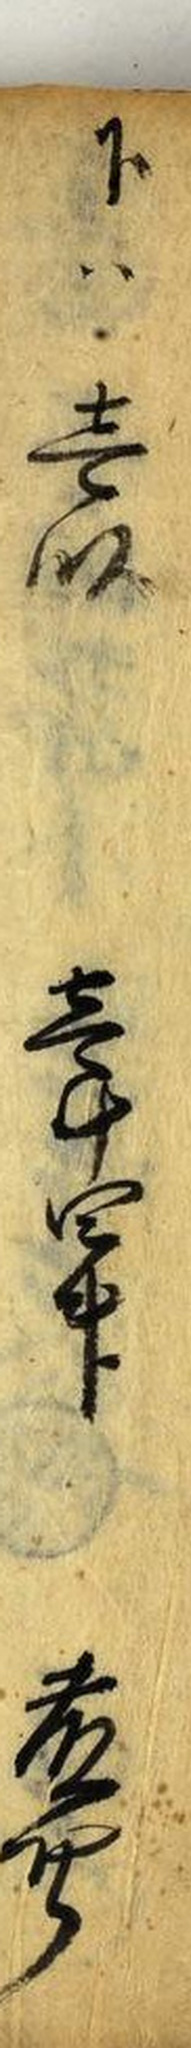下同壱畝壱斗四升藤四郎
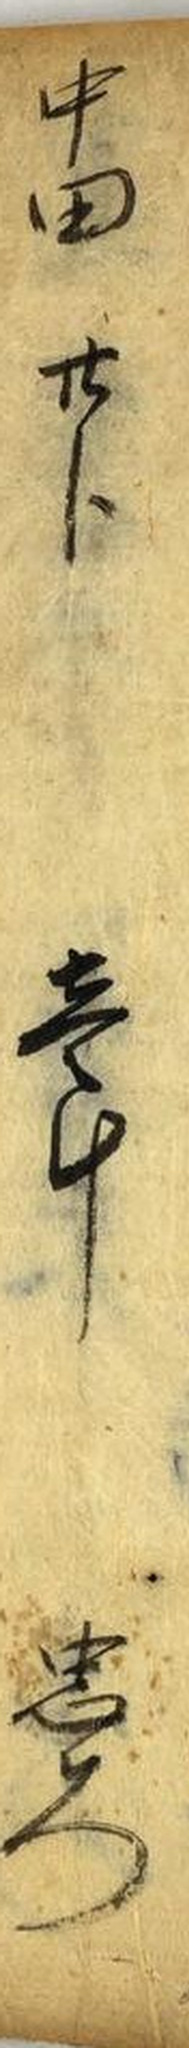中田廿分壱斗忠右衛門
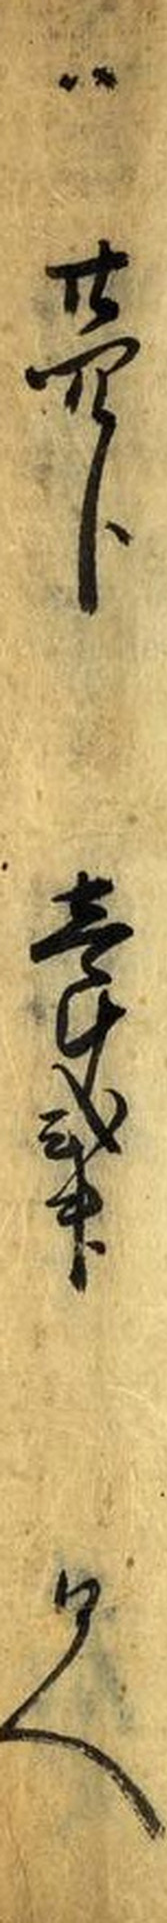同廿四分壱斗弐升同人
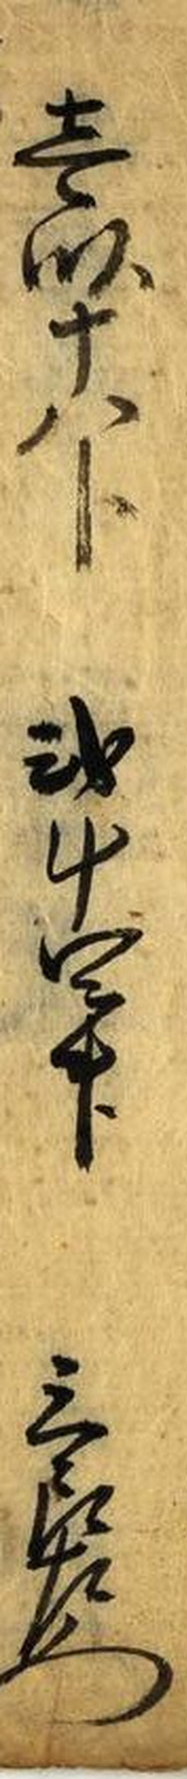同壱畝十八分弐斗四升三郎左衛門
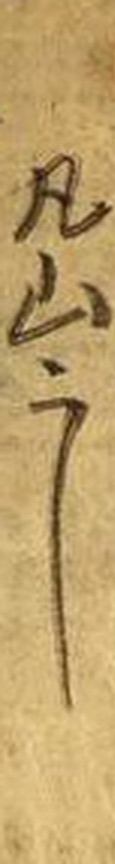丸山こし
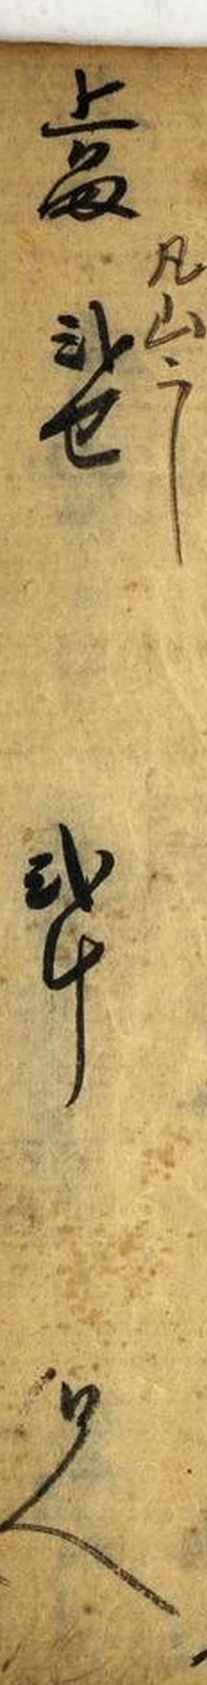上畠弐セ弐斗同人
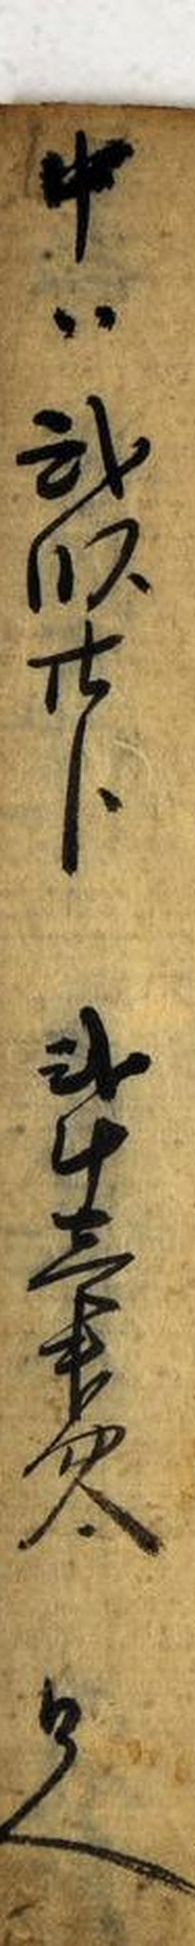中同弐畝廿分弐斗壱升四合同人

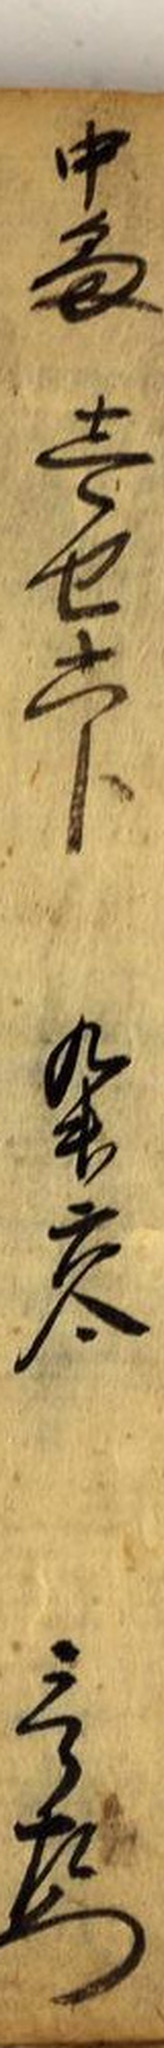中畠壱セ六分九升六合三郎左衛門
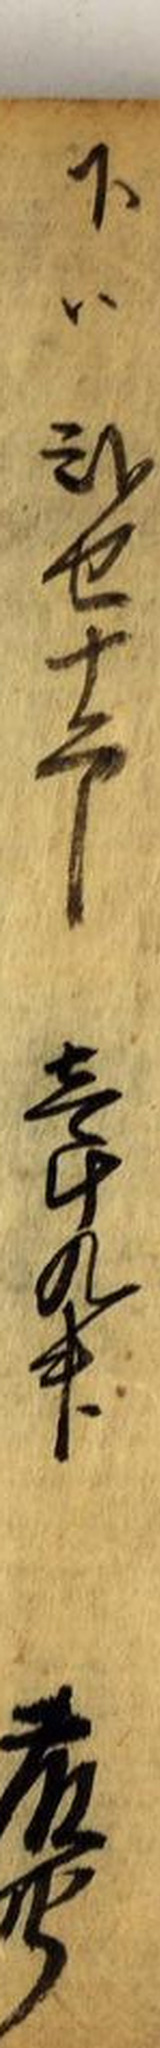下同弐セ十二分壱斗九升藤四郎
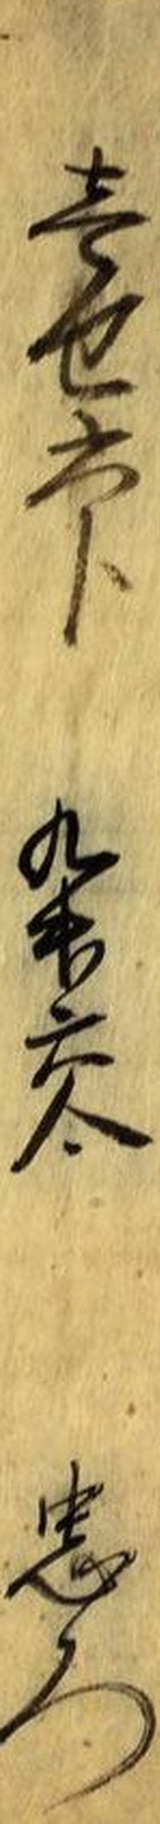同壱セ六分九升六合忠右衛門
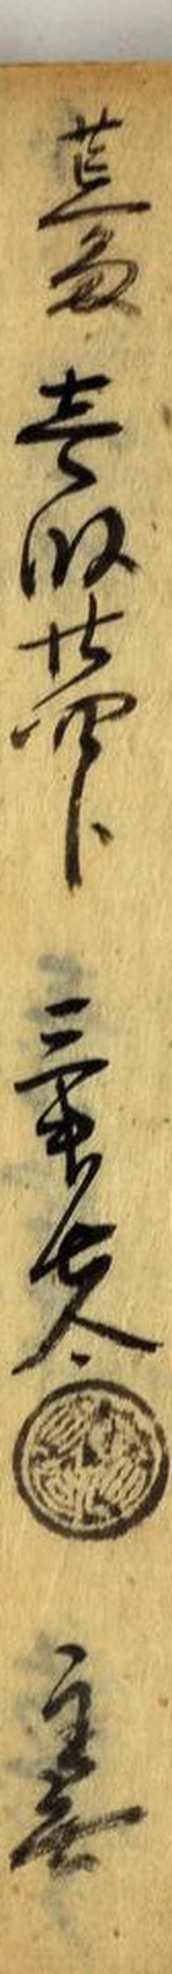荒畠壱畝廿四分三升七合㊞主無
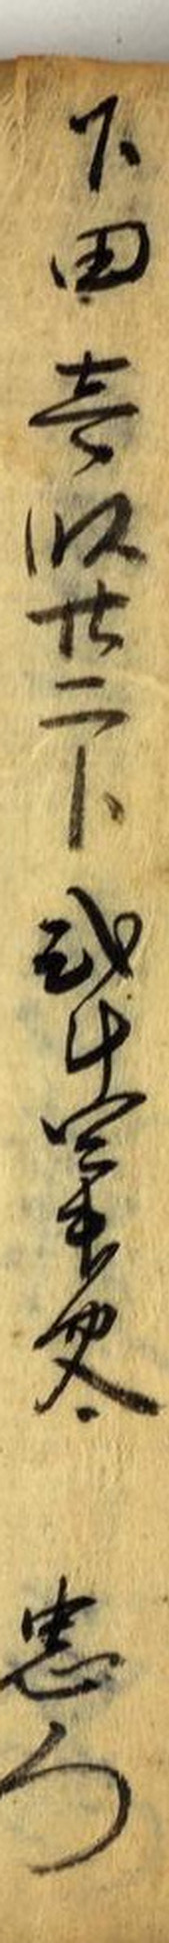下田壱畝廿二分弐斗四升四合忠右衛門
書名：越前国西方内志津庄内本折村御検地帳
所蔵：福井県文書館 Fukui Prefectural Archives
